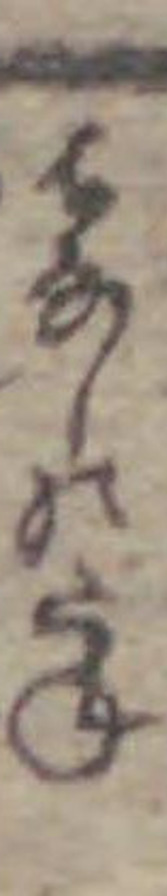はなしのたね
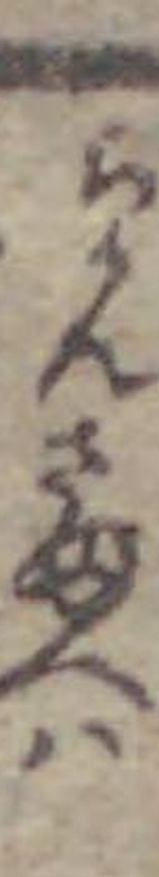らかんさまへは
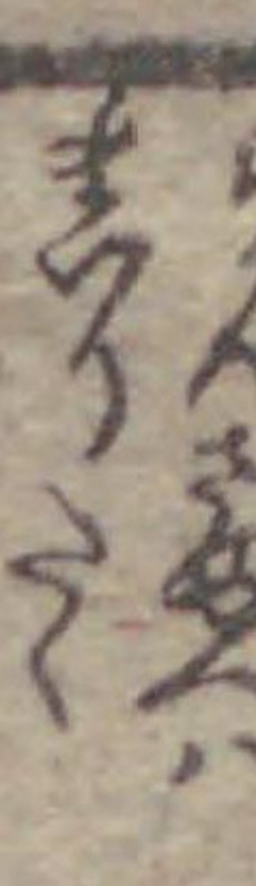まいりたく
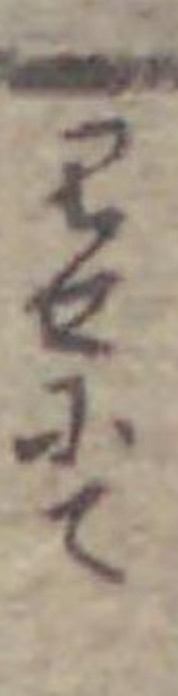みせにて
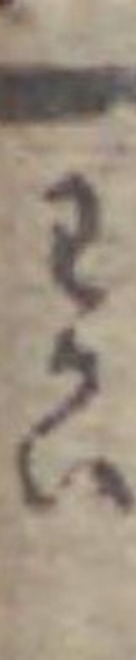わかい
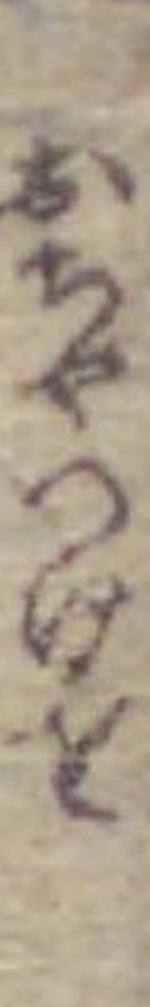おちやつけを
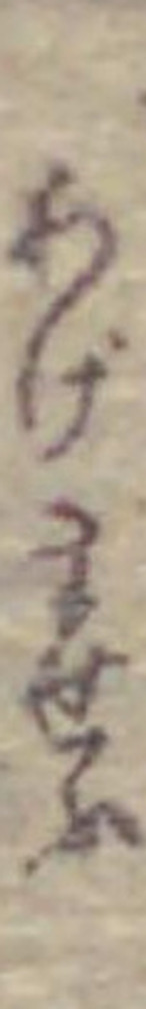あけませふ
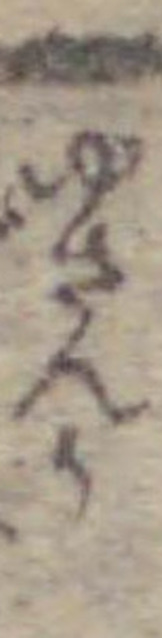ゆさんも
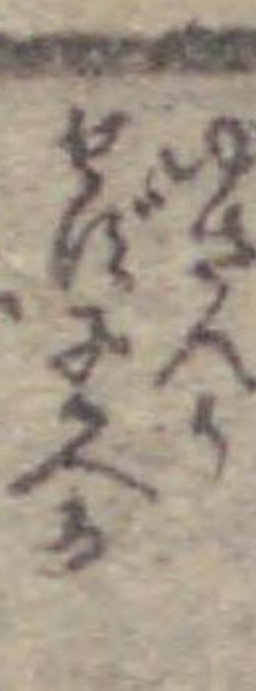せずにかへる
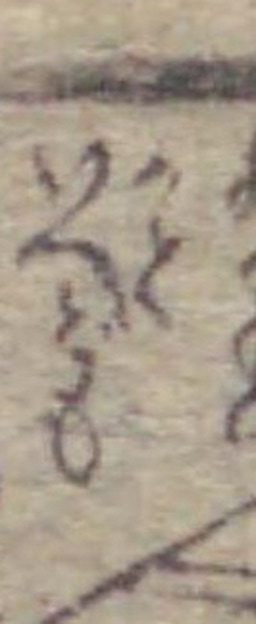いへども

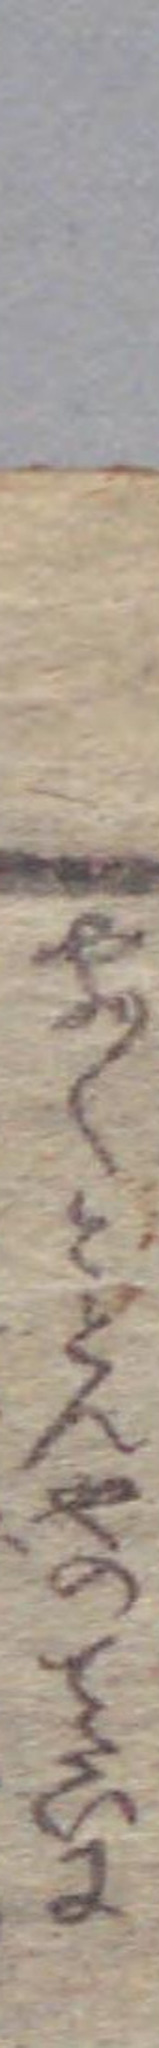やふ〳〵ととんやのてたいに
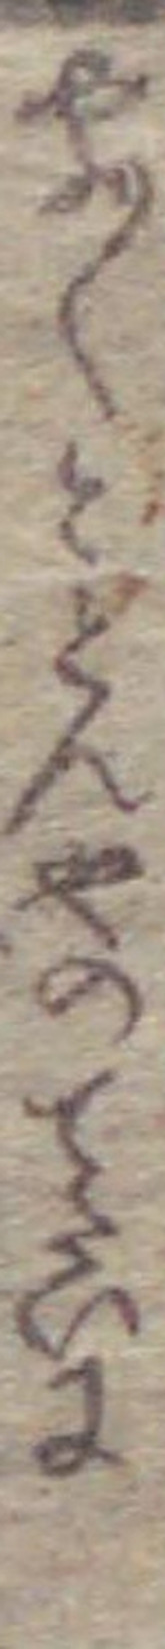やふ〳〵ととんやのてたいに
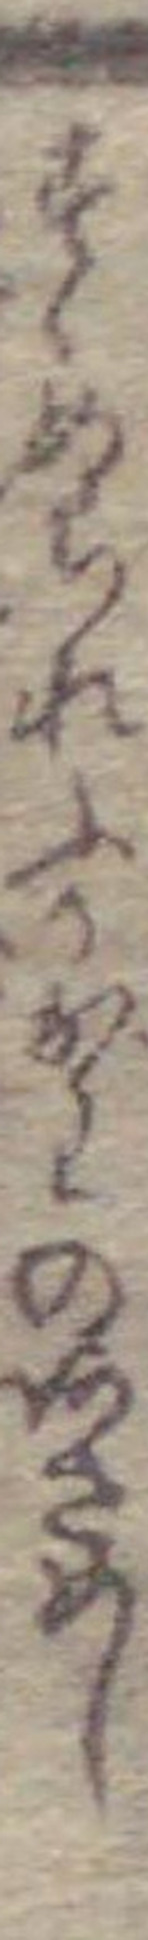すゝめられふかかわのあさめし
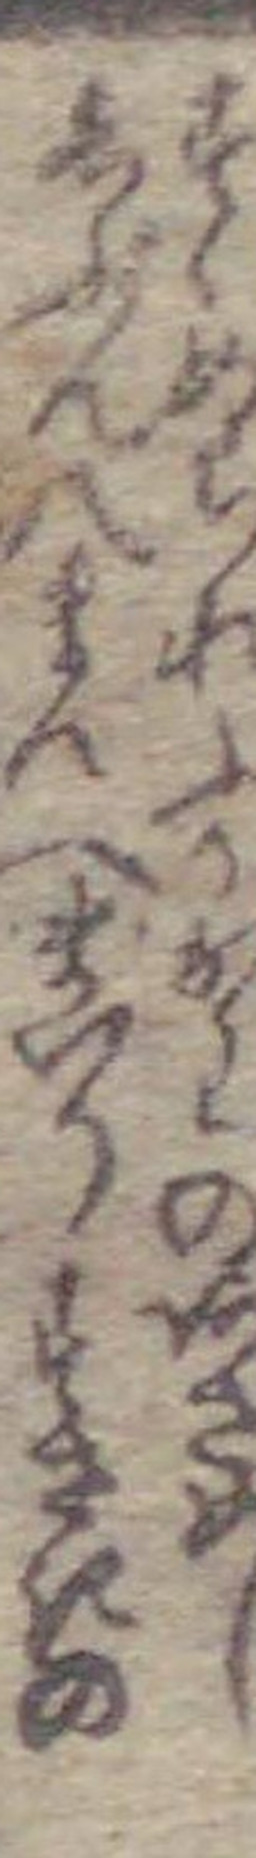じぶん八まんへまいりすさきの
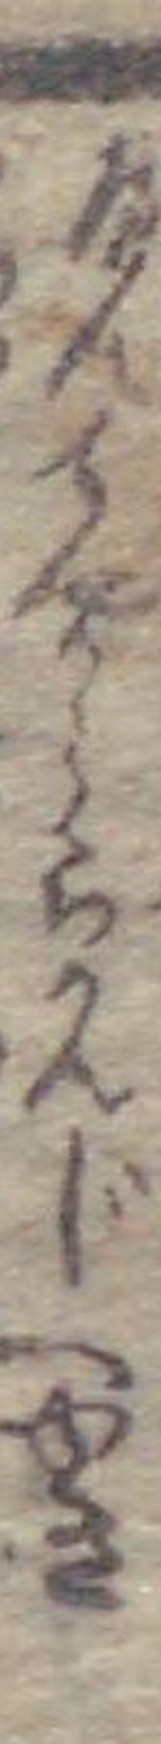へんてんかららかんじへゆき
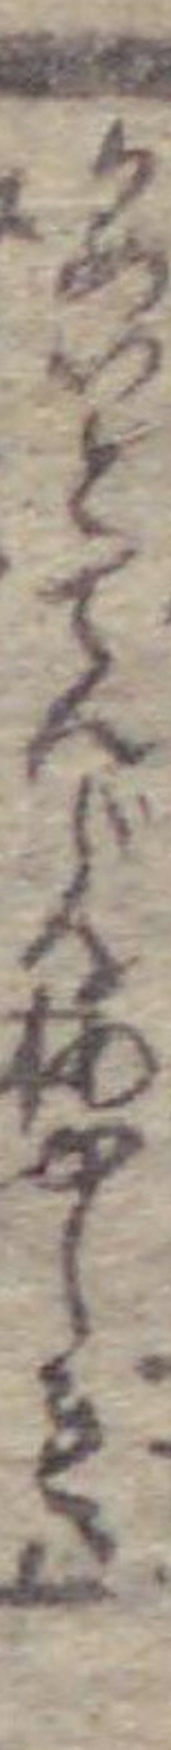かめいとのてんじん梅やしきは
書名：見通占 : 3巻
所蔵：国立国会図書館 National Diet Library, JAPAN
